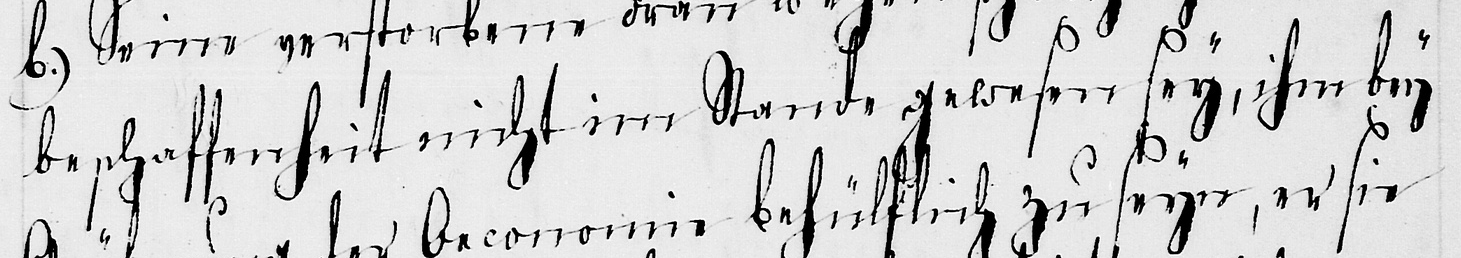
beschaffenheit nicht im Stande gewesen sey, ihm bey
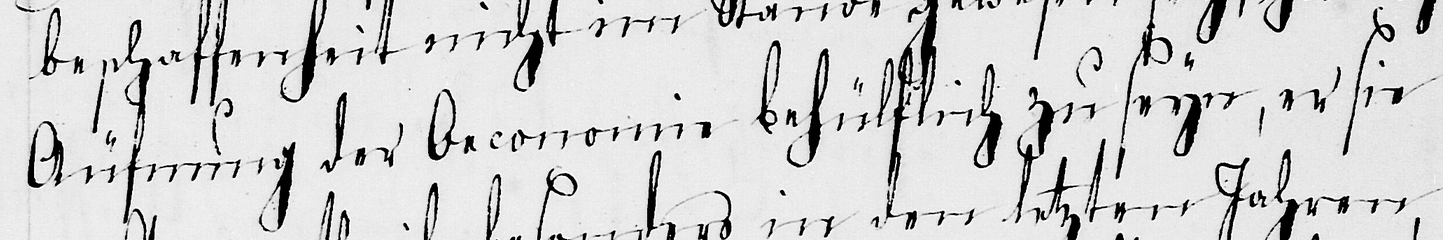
Äufnung der Oeconomie behülflich zu seyn, er sie
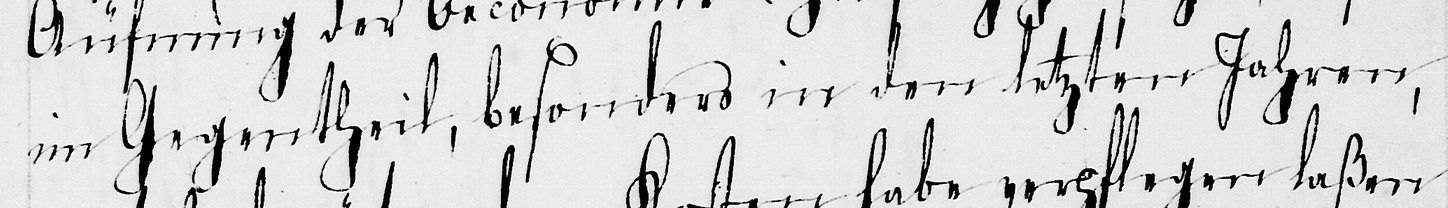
im Gegentheil, besonders in den letzten Jahren,
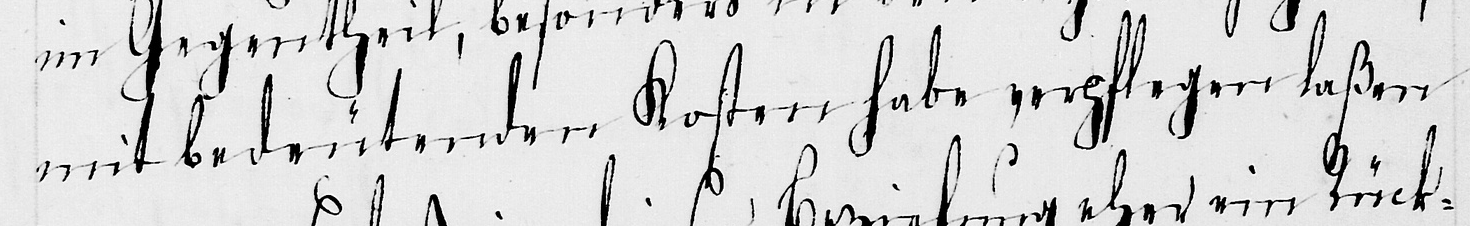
mit bedeutenden Kosten habe verpflegen laßen
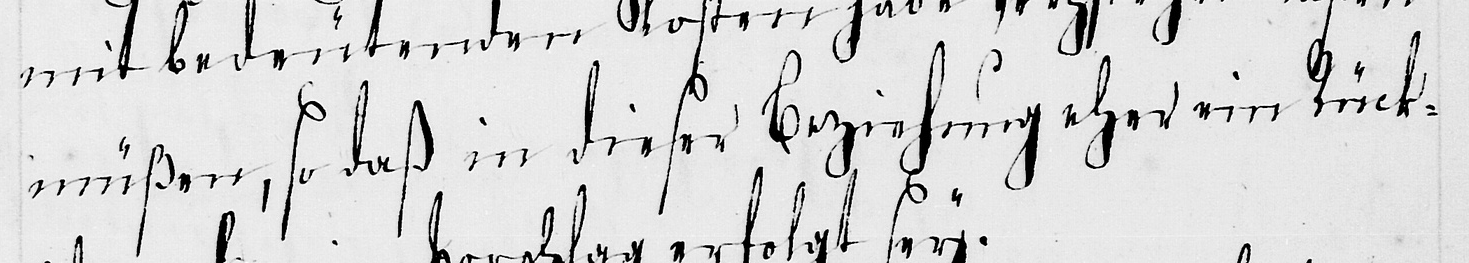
müßen, so daß in dieser Beziehung eher ein Rück¬
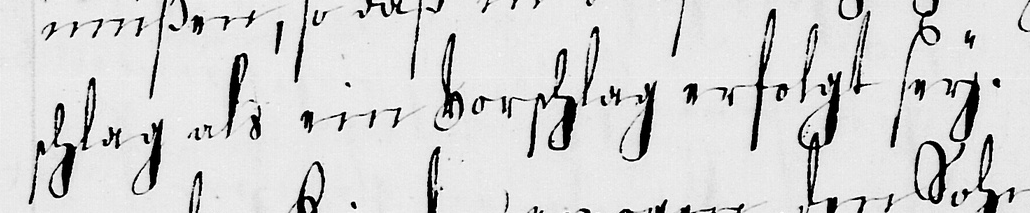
schlag als ein Vorschlag erfolgt sey.
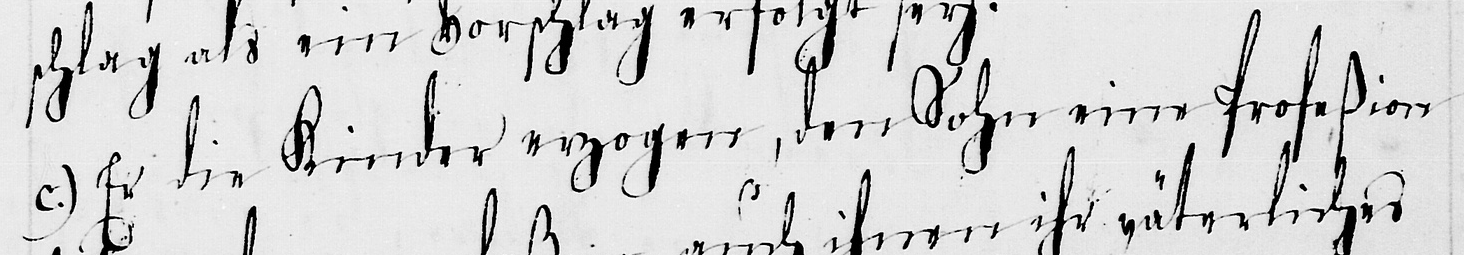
c.) Er die Kinder erzogen, den Sohn eine Profeßion
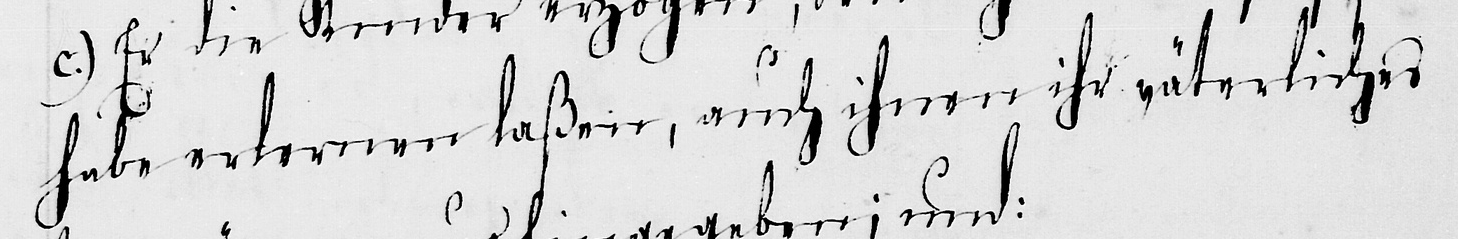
habe erlernen laßen, auch ihnen ihr väterliches
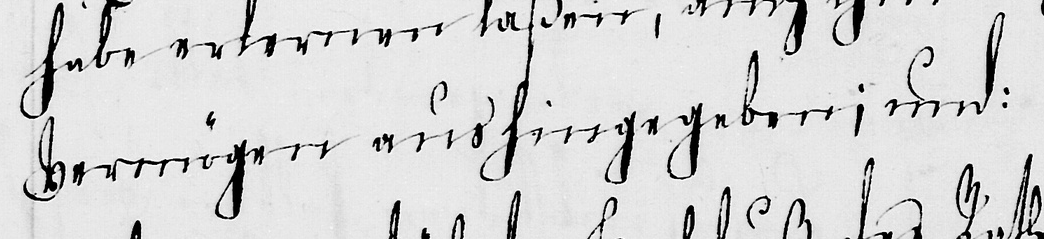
Vermögen aushingegeben; und:
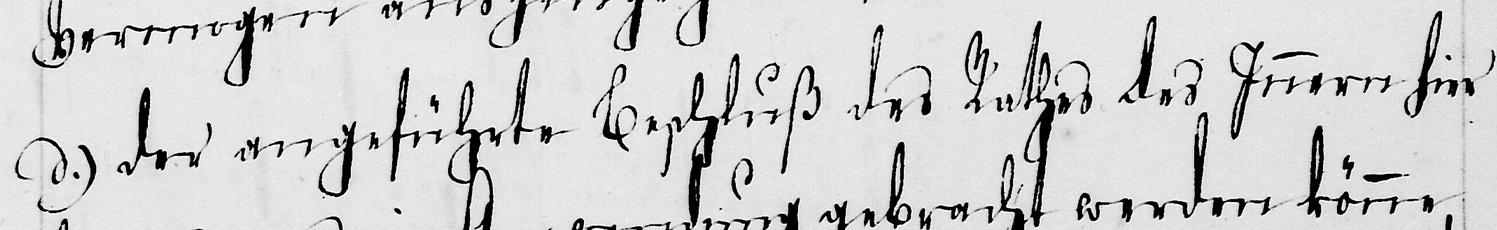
d.) Der angeführte Beschluß des Rathes des Innern hier
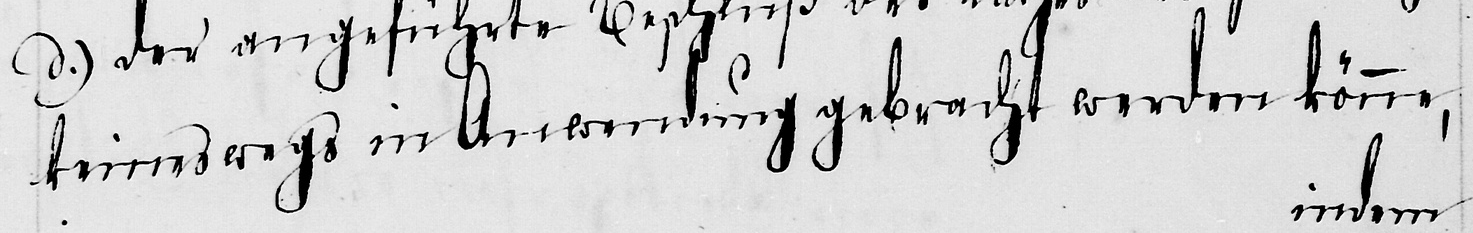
keineswegs in Anwendung gebracht werden könne,
